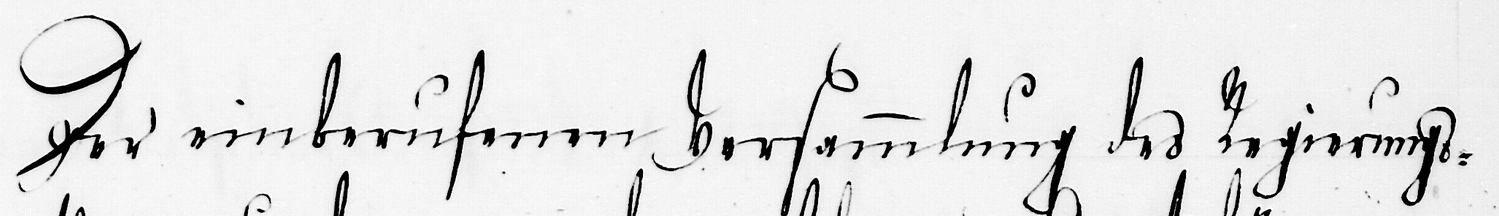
Der einberufenen Versammlung des Regierungs¬
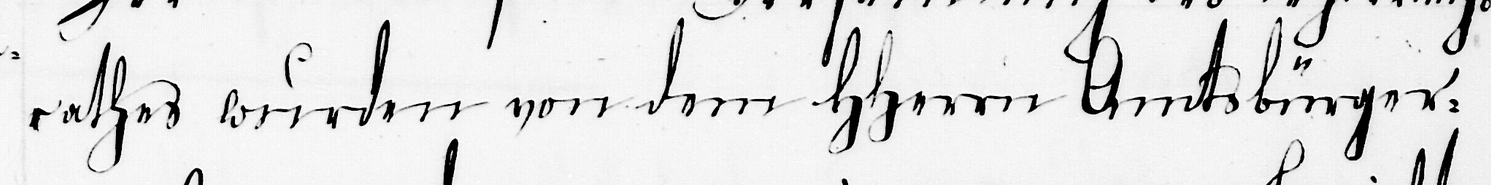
rathes wurden von dem HHerrn Amtsbürger¬
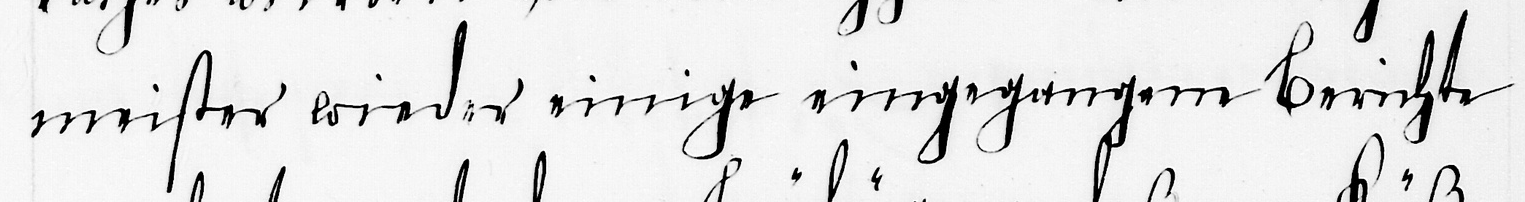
meister wieder einige eingegangene Berichte
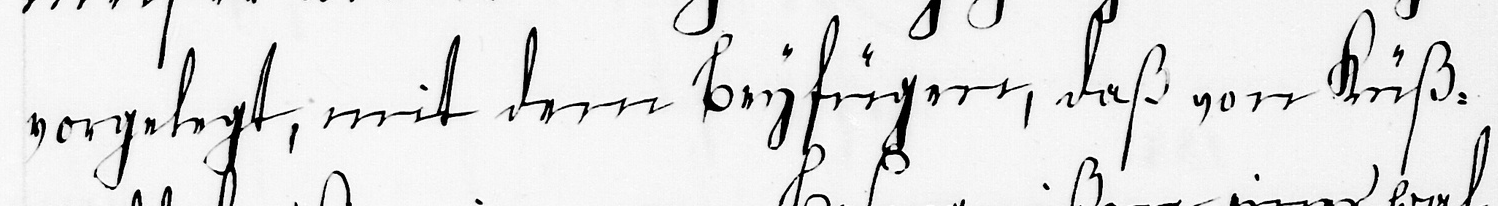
vorgelegt, mit dem Beyfügen, daß von Küß¬
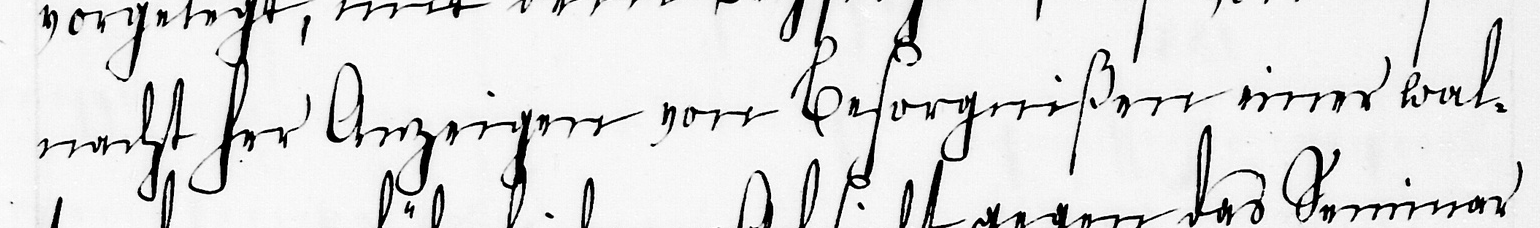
nacht der her Anzeigen von Besorgnißen einer wal¬
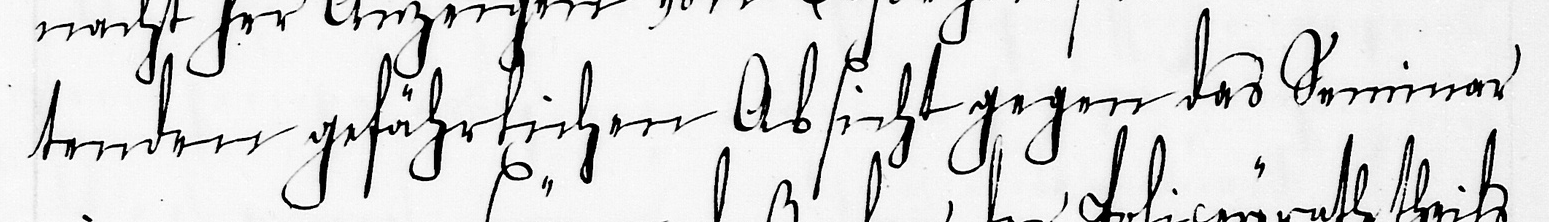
tenden gefährlichen Absicht gegen das Seminar
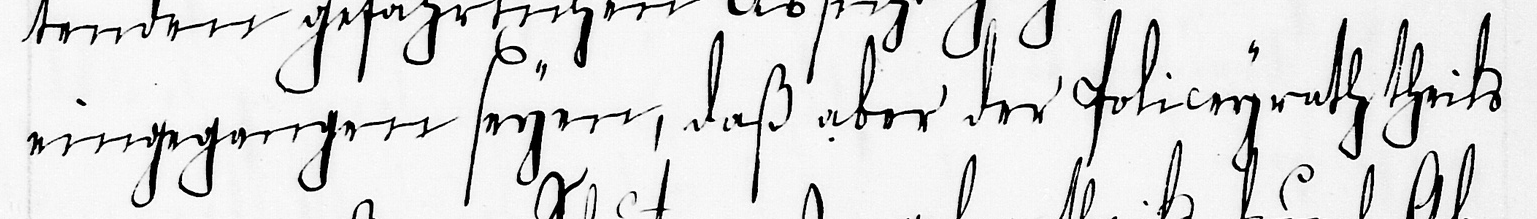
eingegangen seyen, daß aber der Policeyrath theils
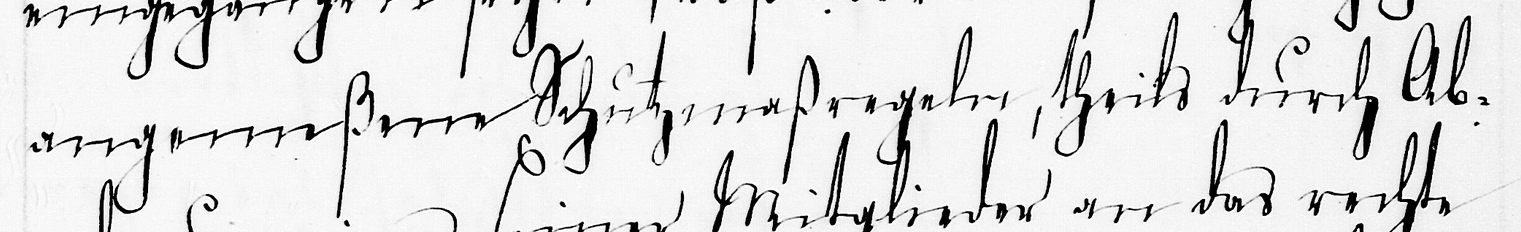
angemeßene Schutzmaßregeln, theils durch Ab¬
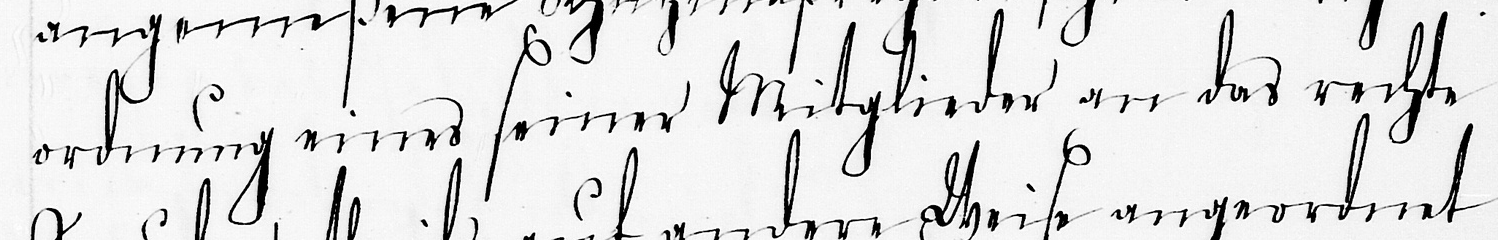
ordnung eines seiner Mitglieder an das rechte
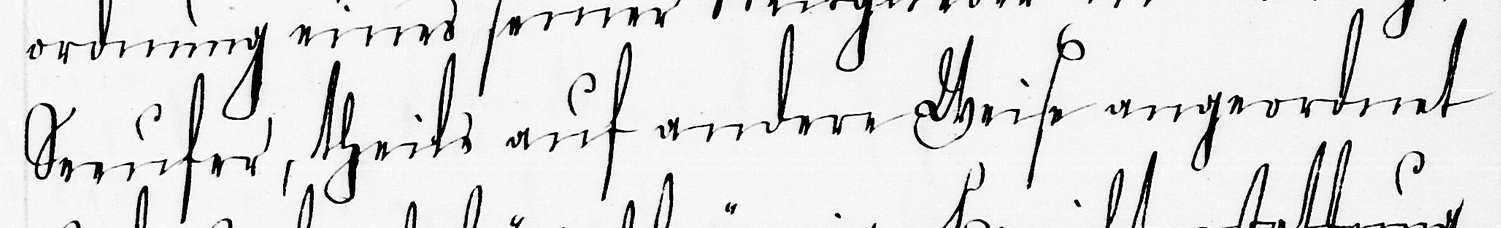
Seeufer, theils auf andere Weise angeordnet
